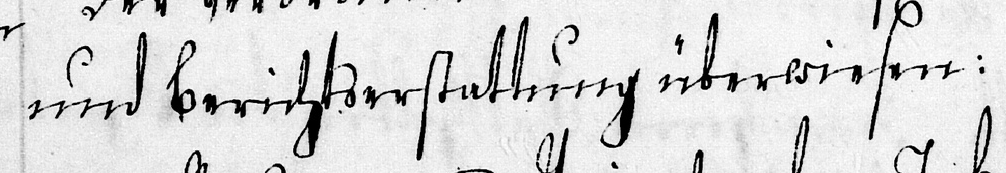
und Berichtserstattung überwiesen:
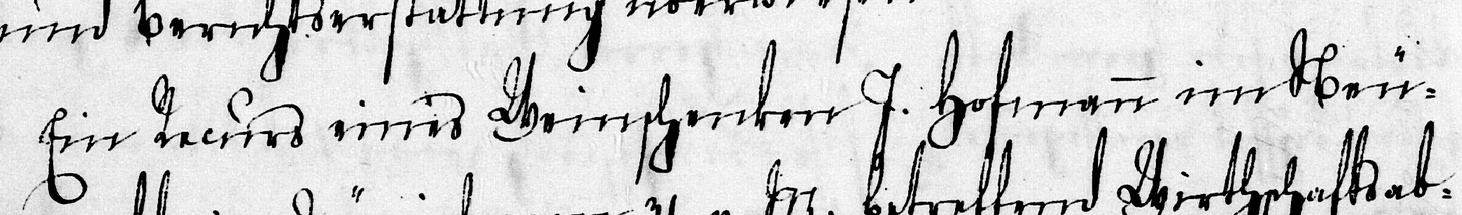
Ein Recurs eines Weinschenken J. Hofmann im Neu¬
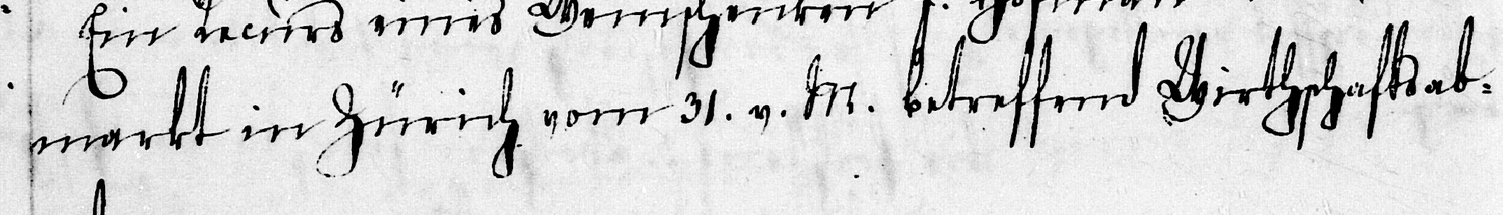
markt in Zürich vom 31. v. M. betreffend Wirthschaftsab¬
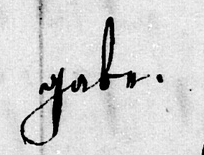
gabe.
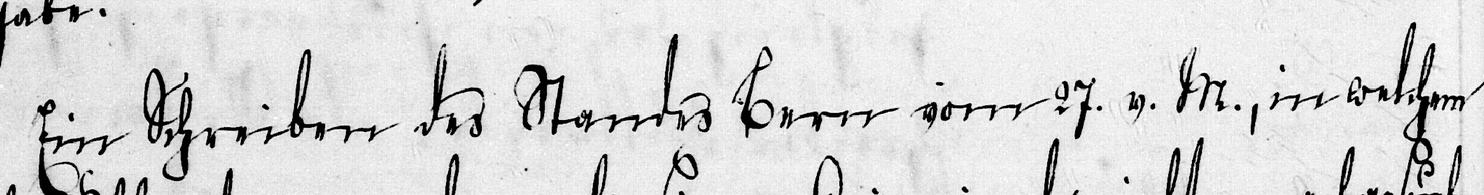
Ein Schreiben des Standes Bern vom 27. v. M., in welchem
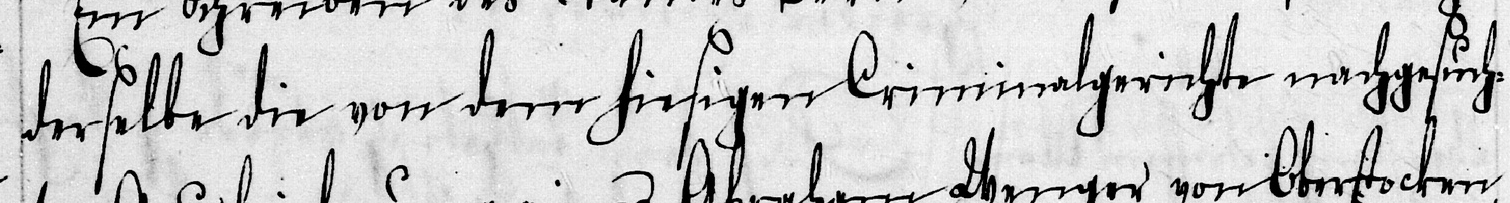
derselbe die von dem hiesigen Criminalgerichte nachgesuc¬
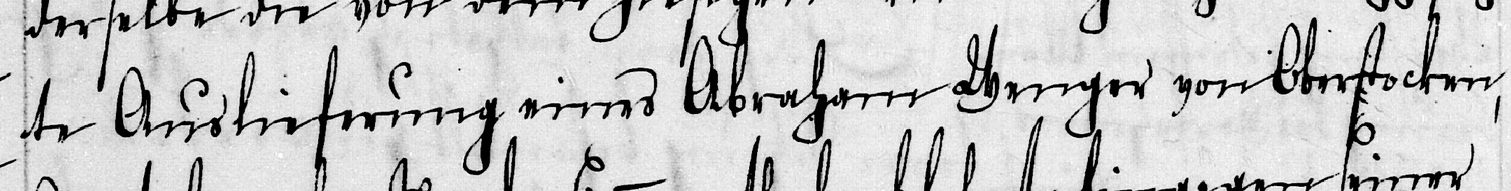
hte Auslieferung eines Abraham Wenger von Oberstocken,
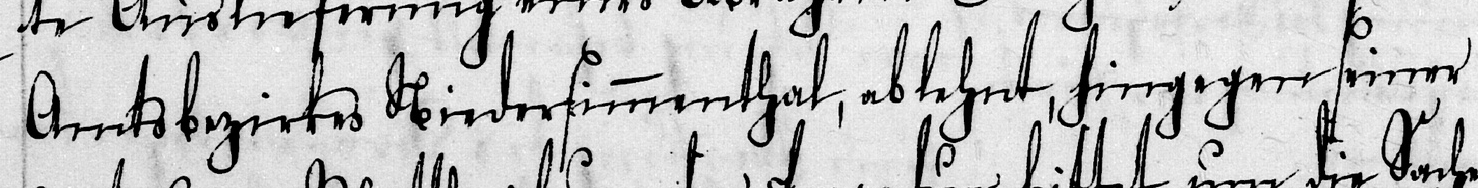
Amtsbezirkes Niedersimmenthal, ablehnt, hingegen seiner
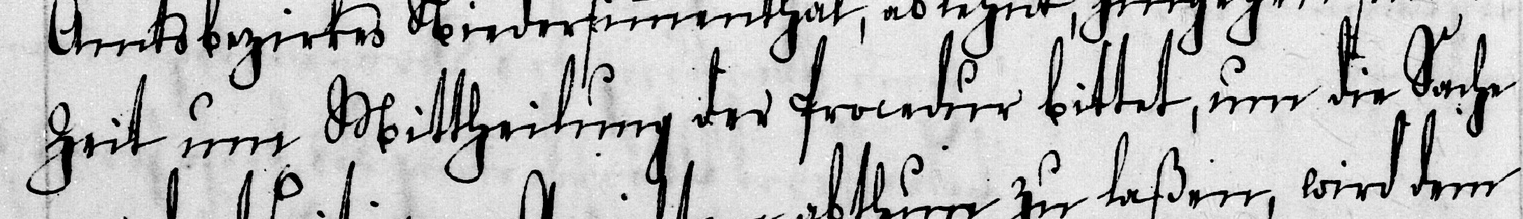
Zeit um Mittheilung der Procedur bittet, um die Sache
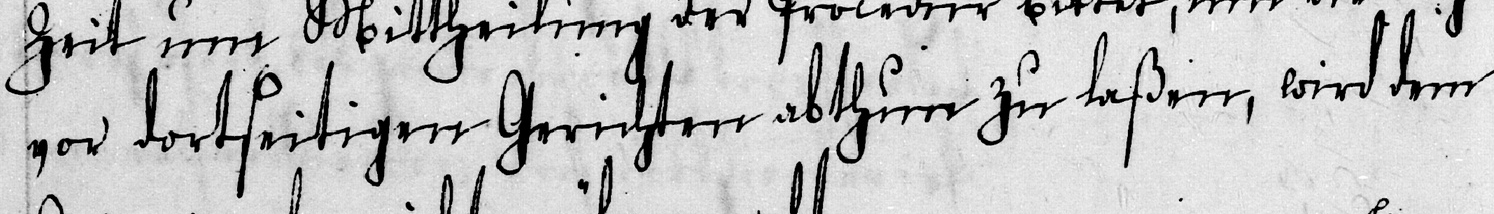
vor dortseitigen Gerichten abthun zu laßen, wird dem
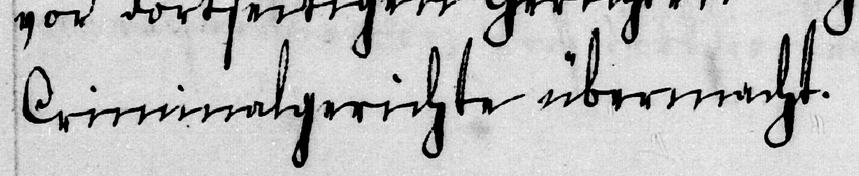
Criminalgerichte übermacht.
